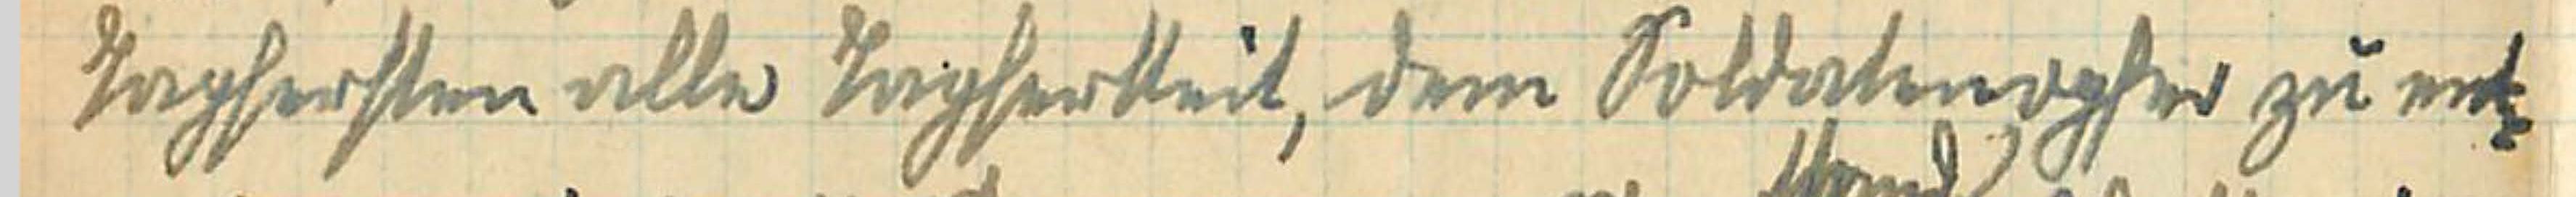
Tapfersten aller Tapferkeit, dem Soldatenopfer zu ent-
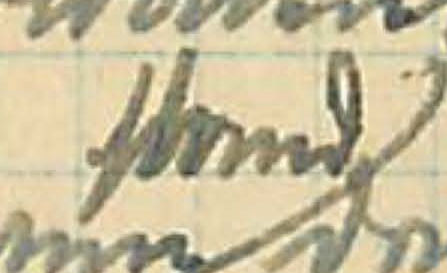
stand
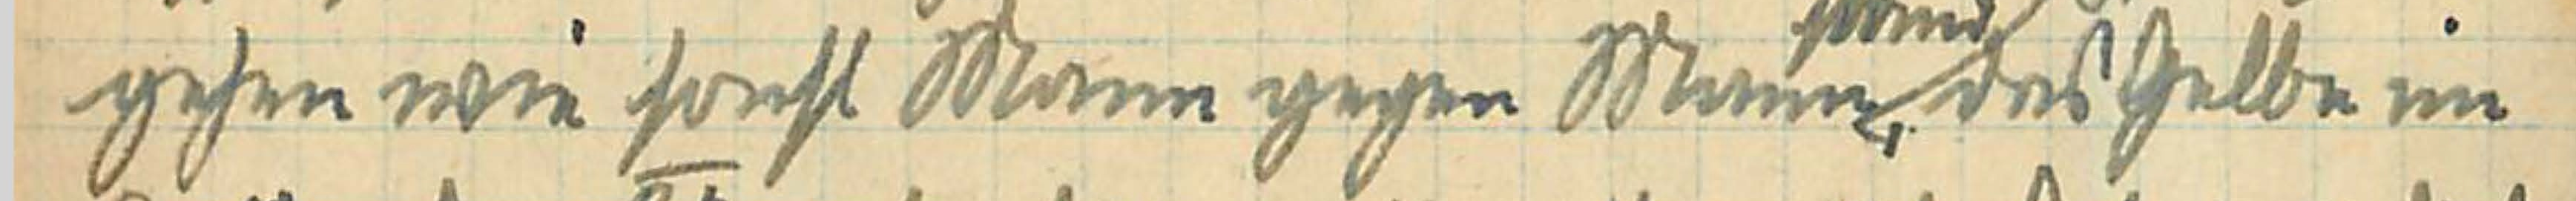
gehen wie sonst Mann gegen Mann, das Gelbe im
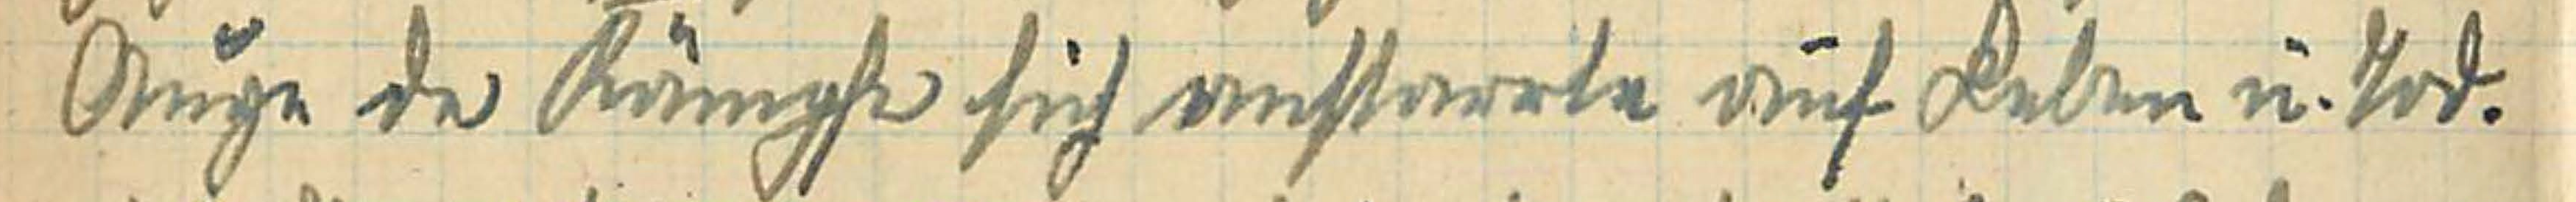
Auge der Kämpfer sich anstarrte auf Leben u. Tod.
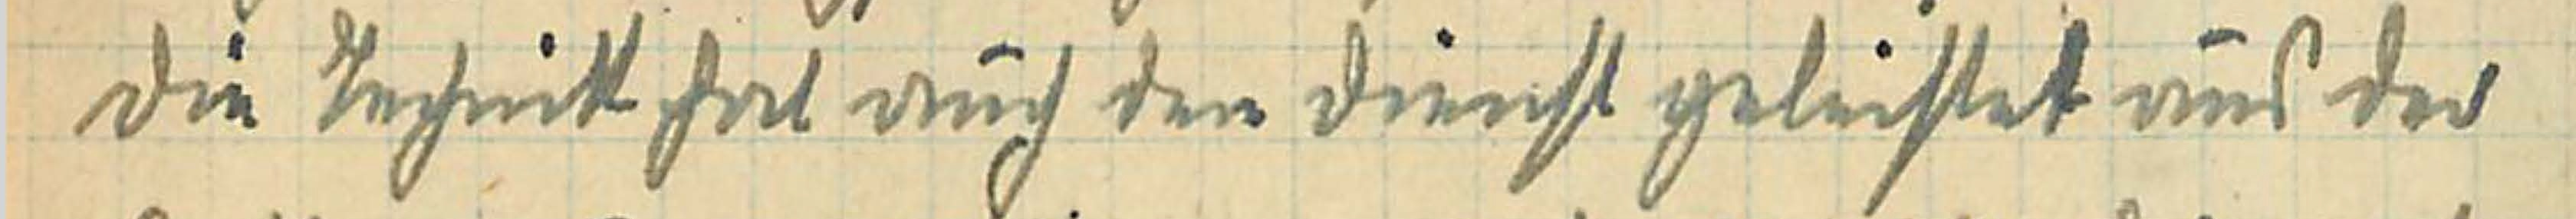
Die Technik hat auch den Dienst geleistet aus der
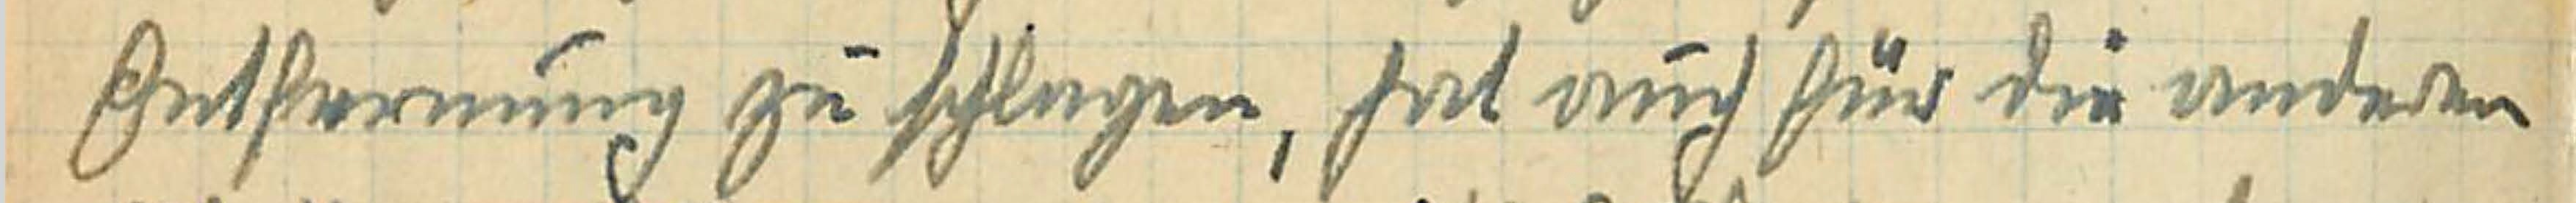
Entfernung zu schlagen, hat auch für die anderen
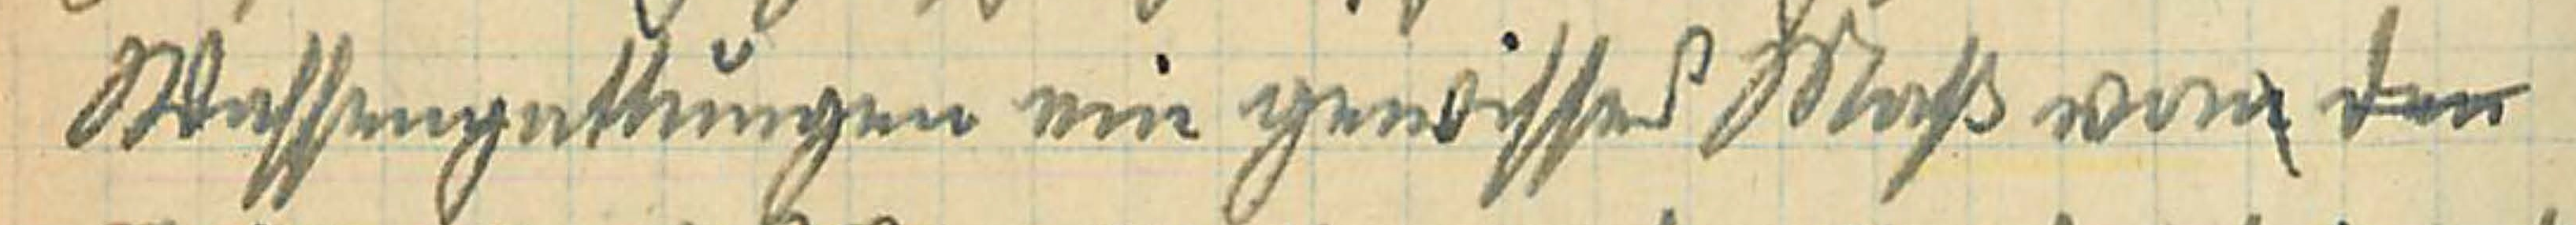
Waffengattungen ein gewisses Maß von der
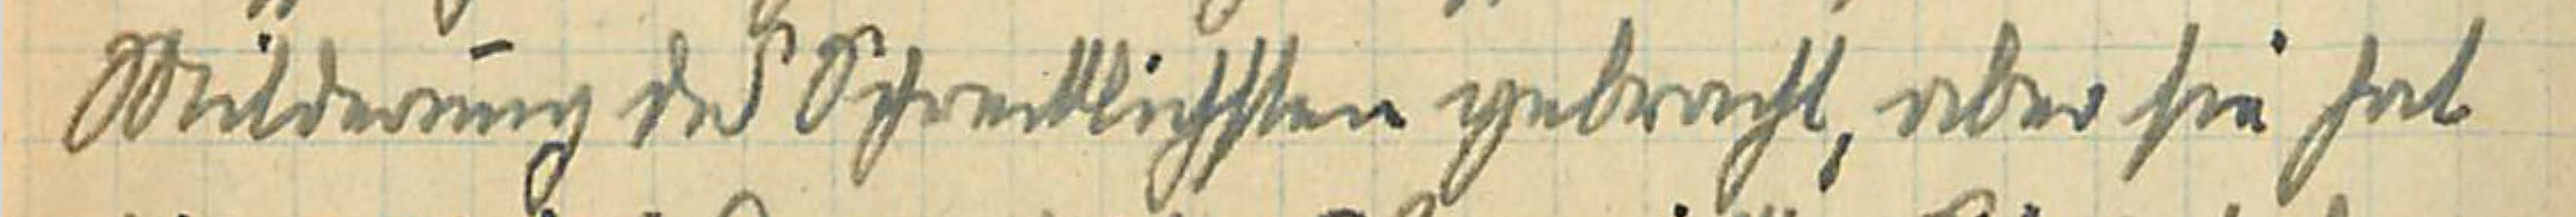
Milderung des Schrecklichsten gebracht, aber sie hat
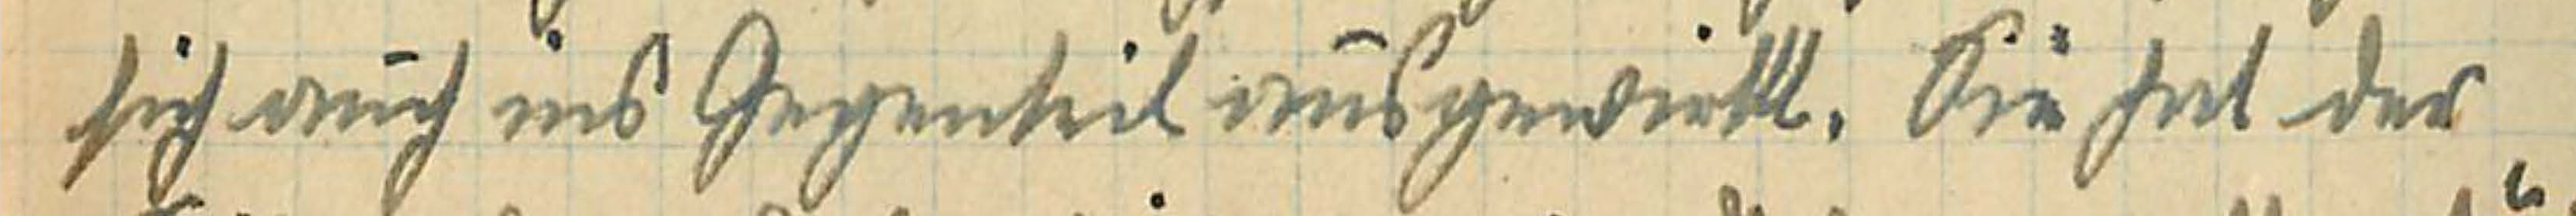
sich auch ins Gegenteil ausgewirkt. Sie hat der
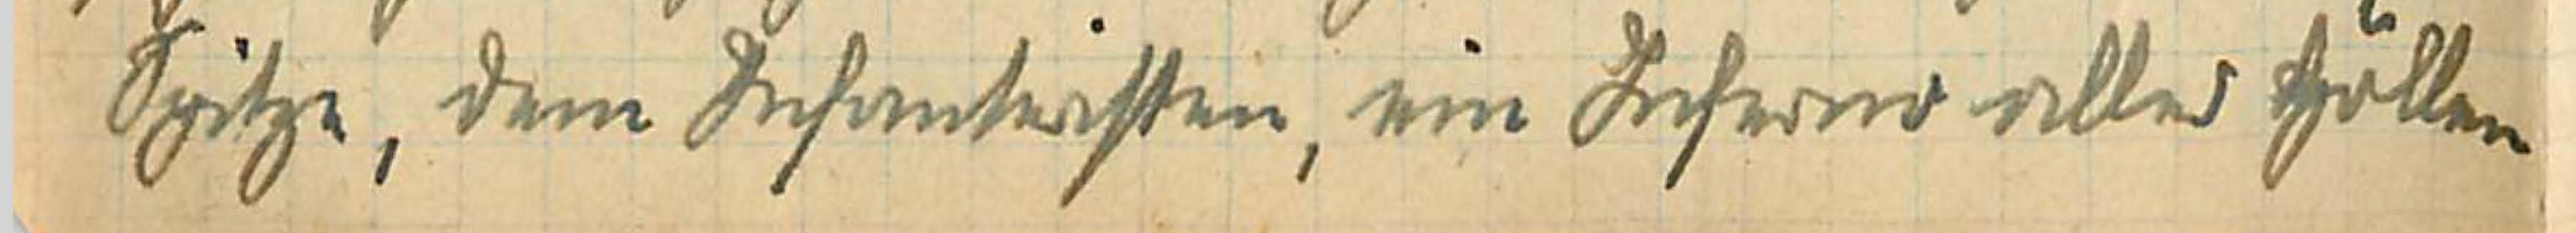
Spitze, dem Infanteristen, ein Inferno aller Höllen
